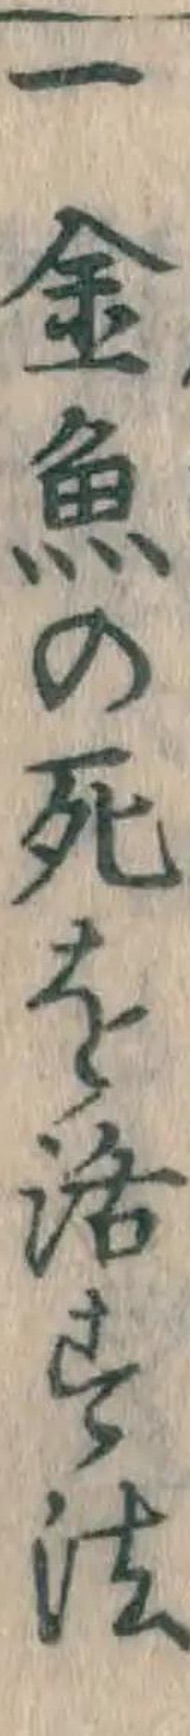一金魚の死を活す法

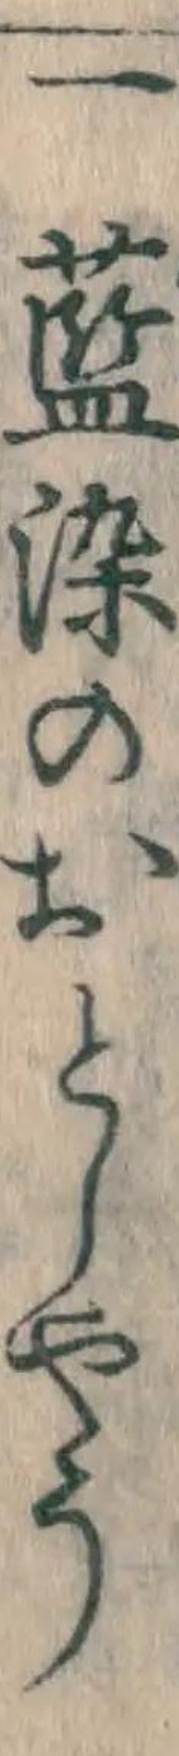一藍染のおとしやう
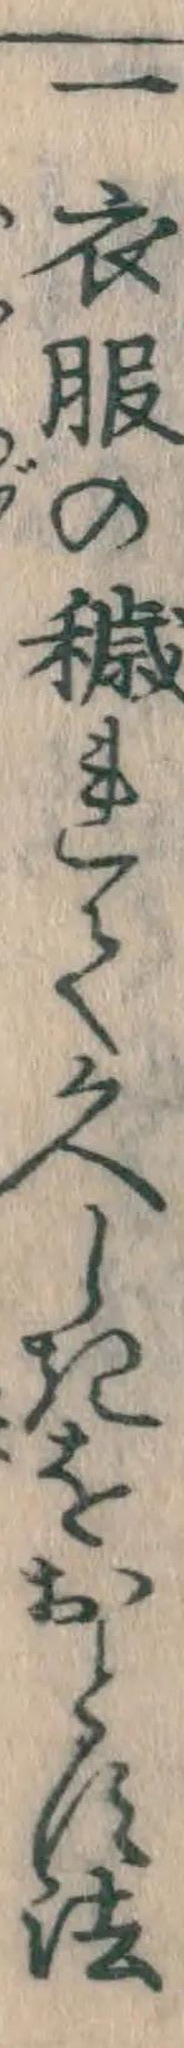一衣服の穢れて久しきをおとす法
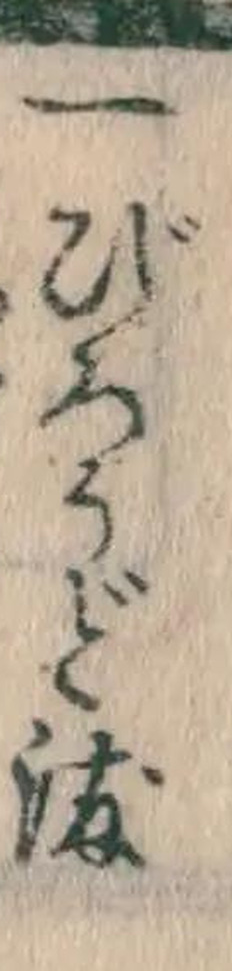一びろうど染
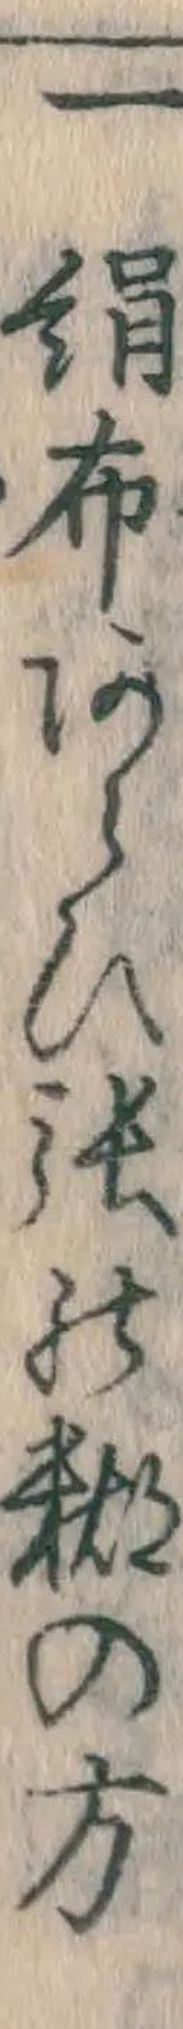一絹布あらひ張の糊の方
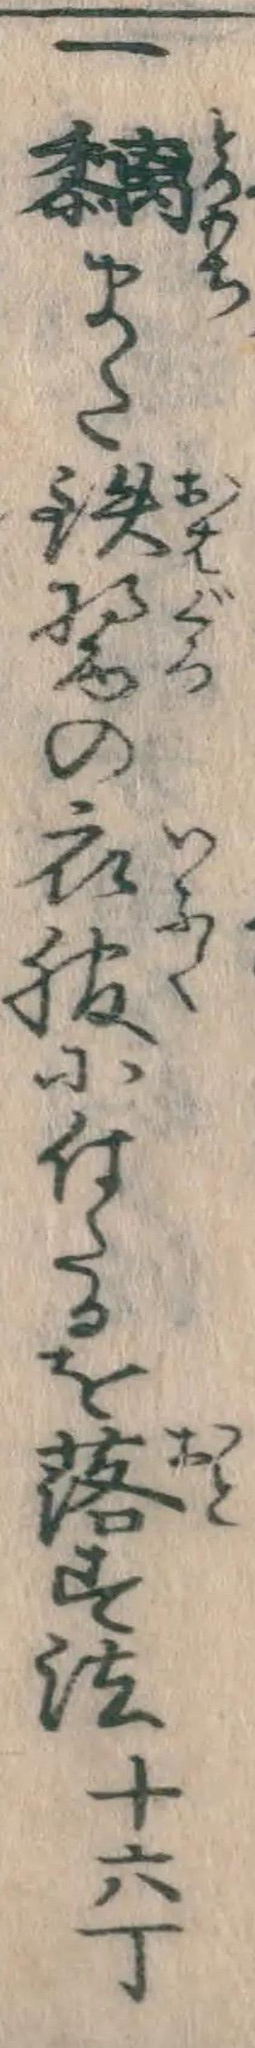一黐また鉄醤の衣服に付たるを落す法十六丁
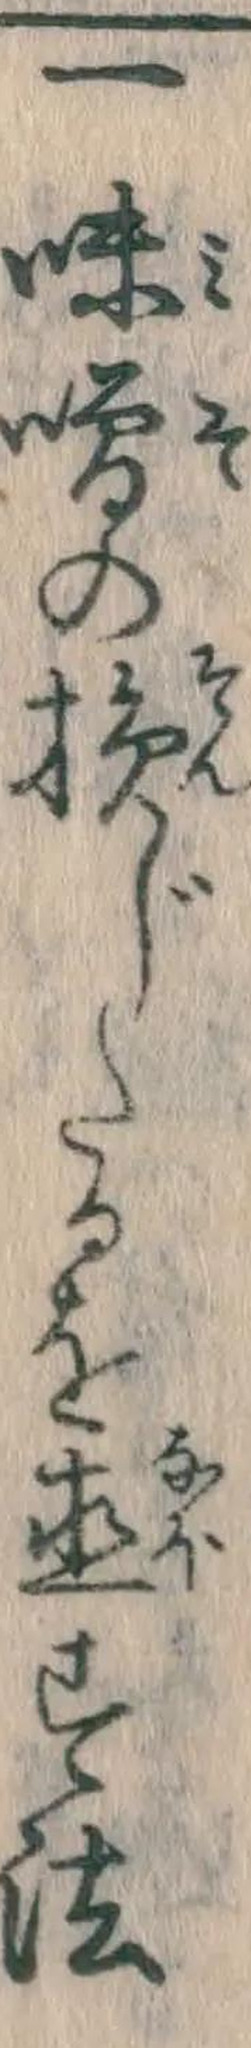一味噌の損じたるを直す法
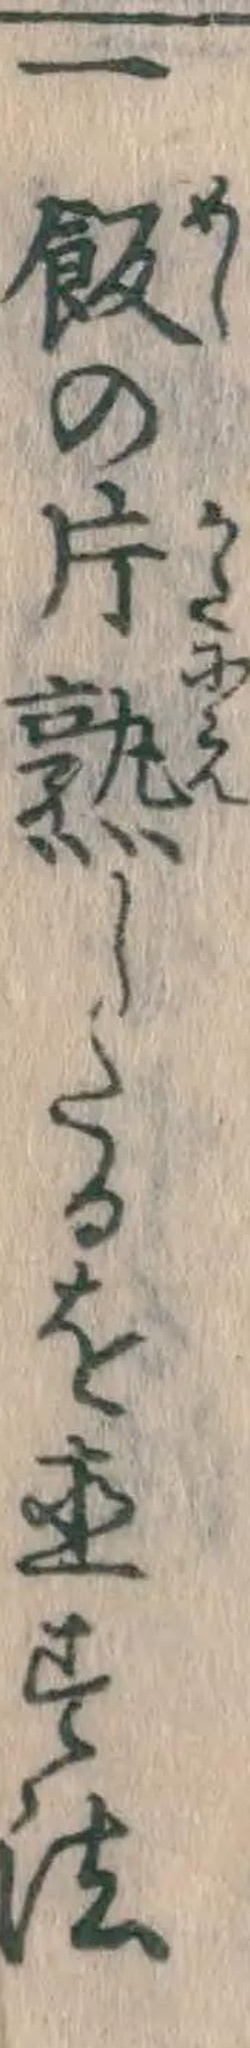一飯の片熟したるを直す法
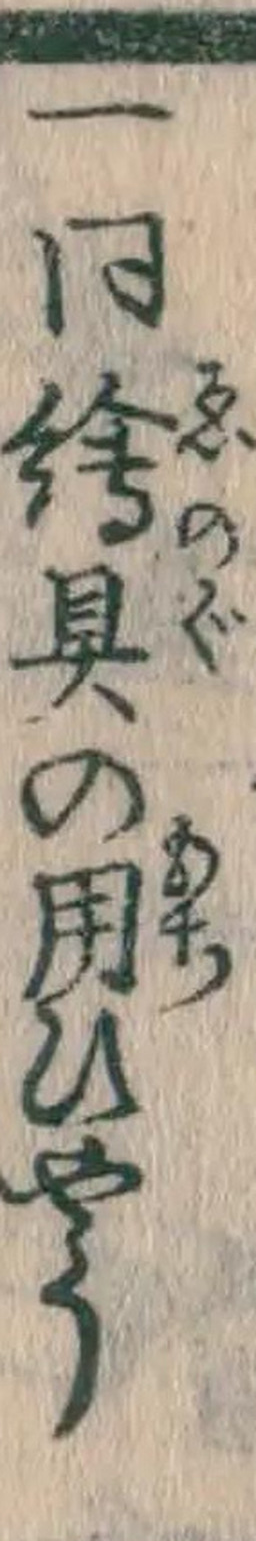一同絵具の用ひやう
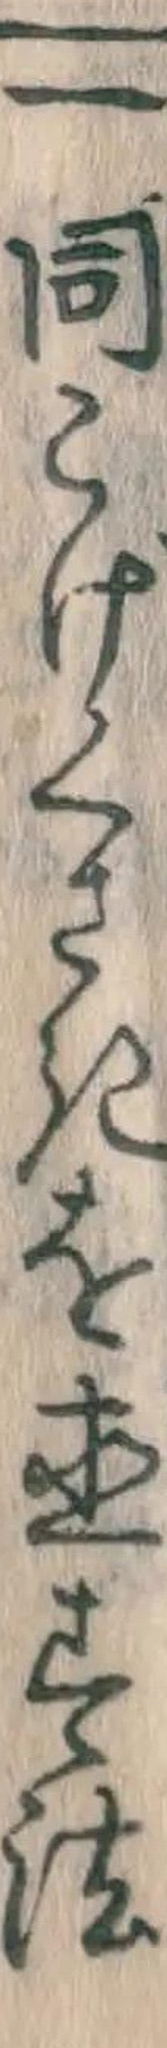一同こげくさきを直す法
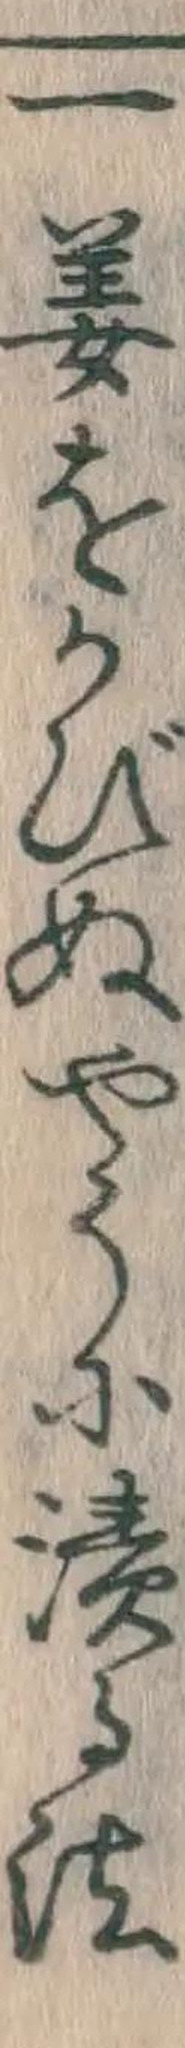一姜をかびぬやうに漬る法
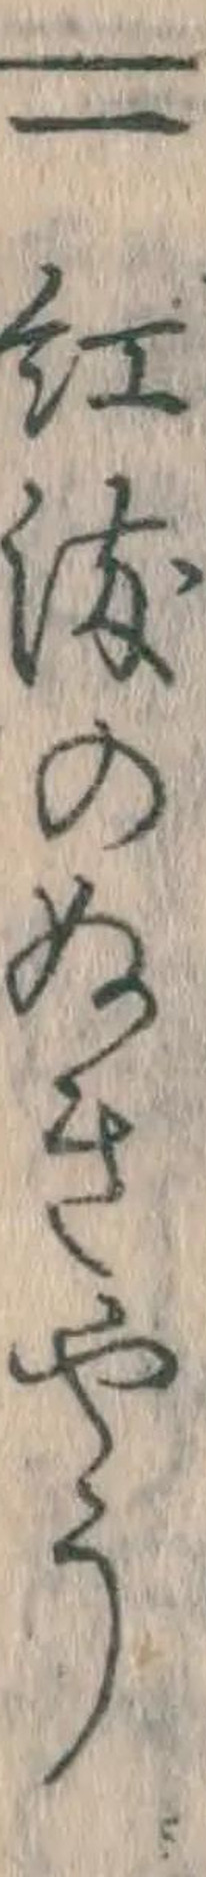一紅染のぬきやう
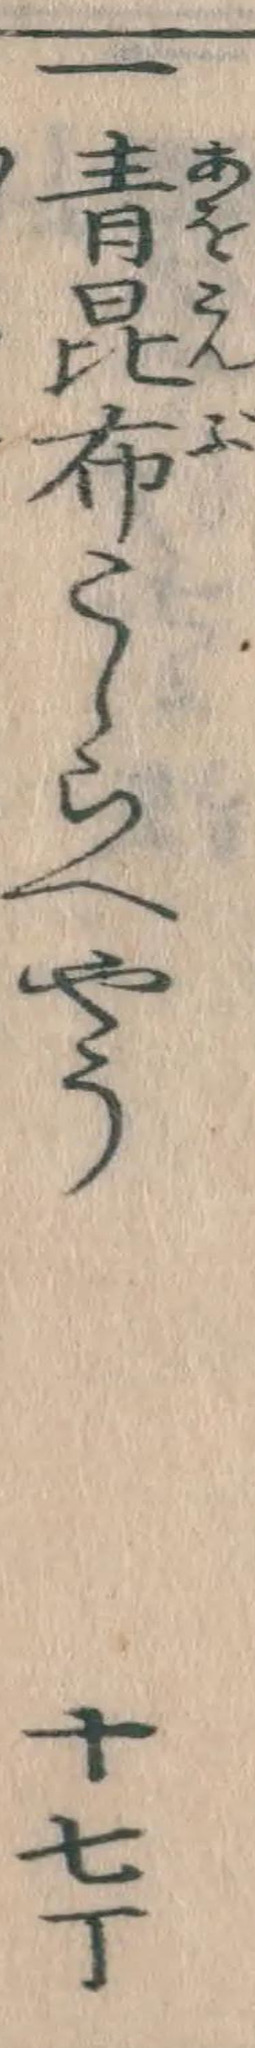一青昆布こしらへやう十七丁
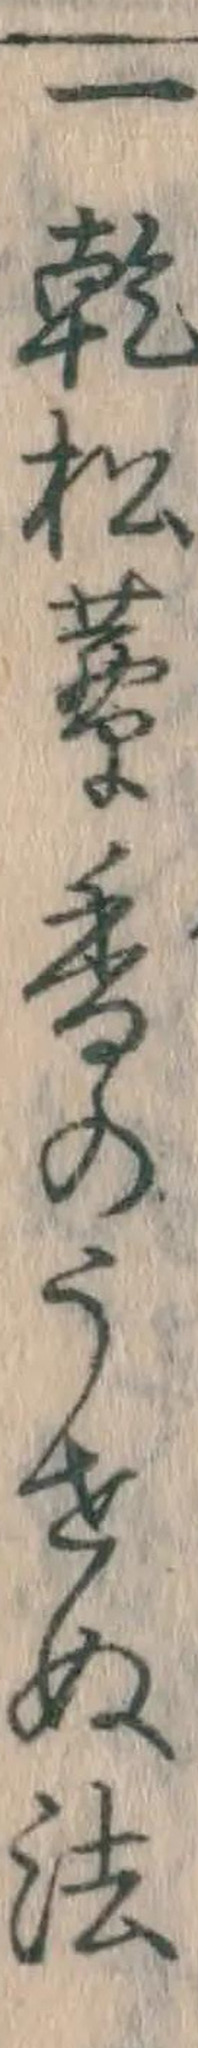一乾松蕈香のうせぬ法
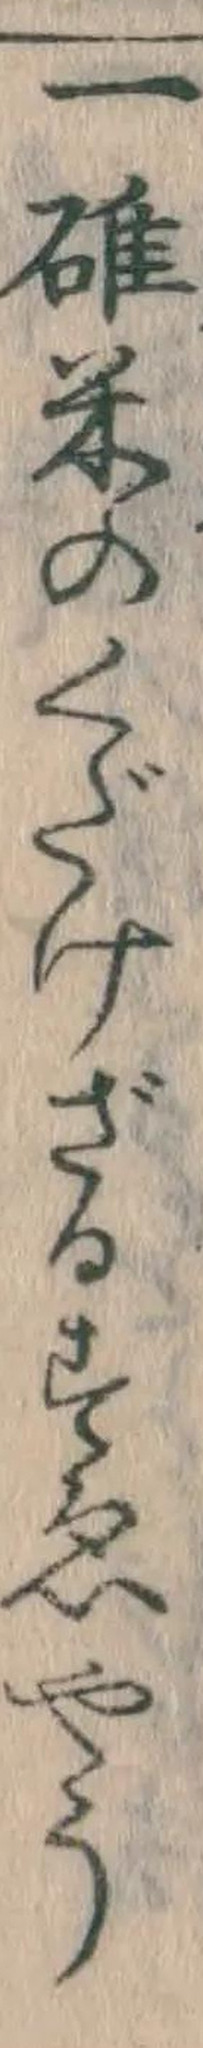一碓米のくだけざるすゑやう
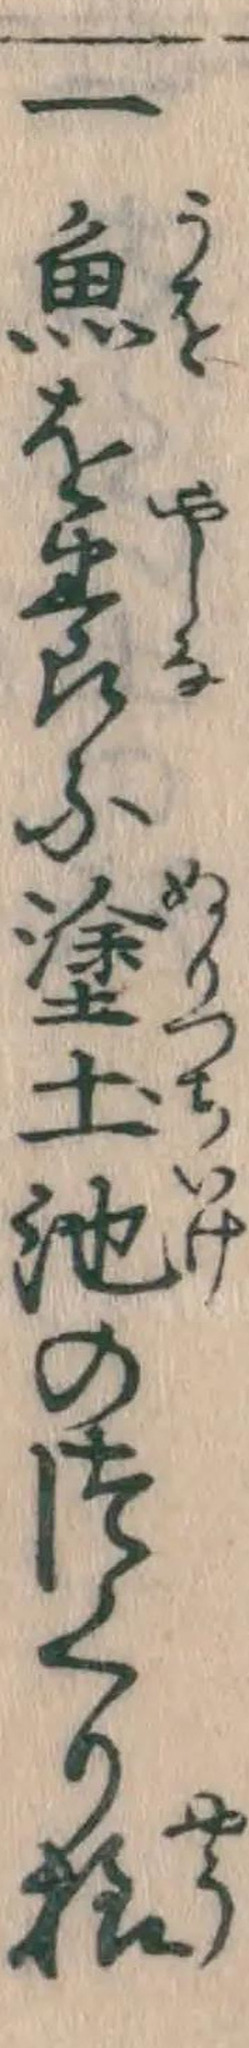一魚を養ふ塗土池のつくり様
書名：広益秘事大全 3巻. [1]
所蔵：国立国会図書館 National Diet Library, JAPAN
